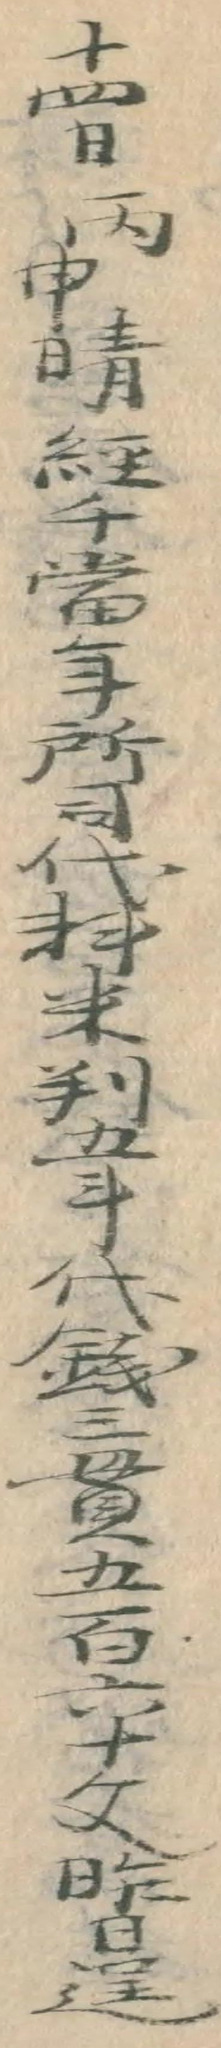十四日丙申晴経千當年所司代料米判五斗代銭三貫五百六十文昨日逞

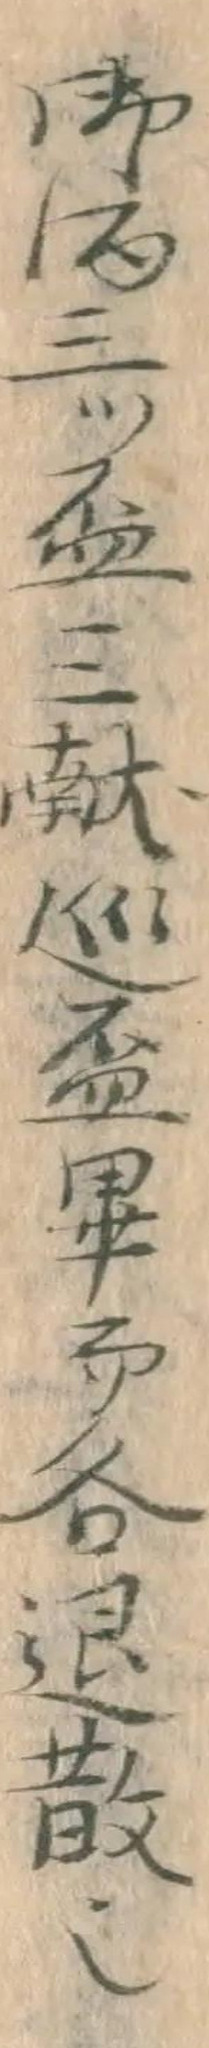御酒三ツ盃三献巡盃畢而各退散也
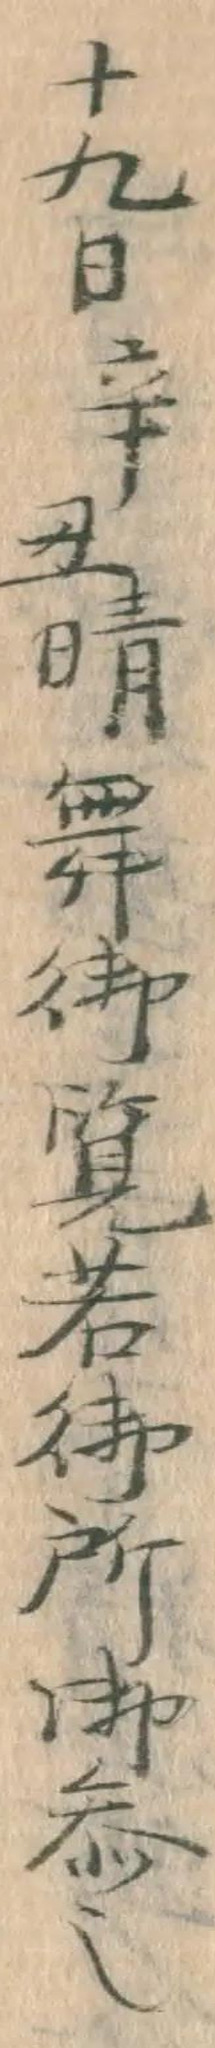十九日辛丑晴舞御覧若御所御参也
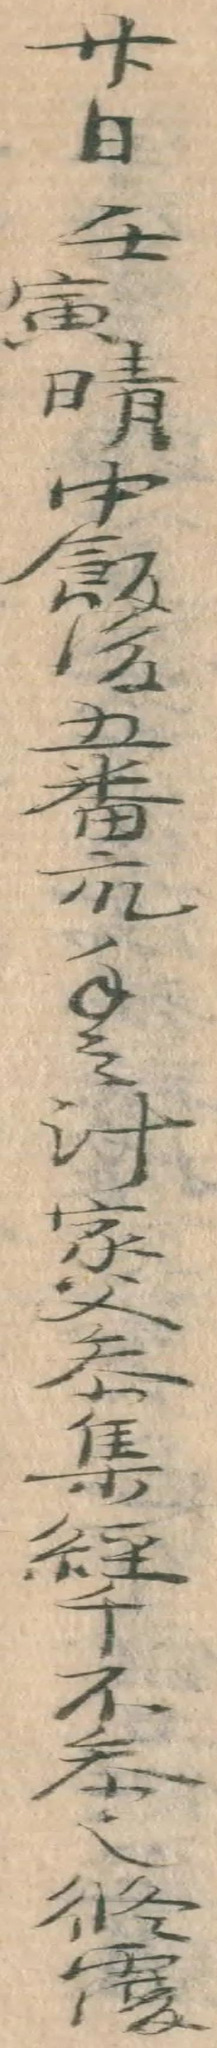廿日壬寅晴中飯後五番衆手之汁家父参集経千不参也修覆
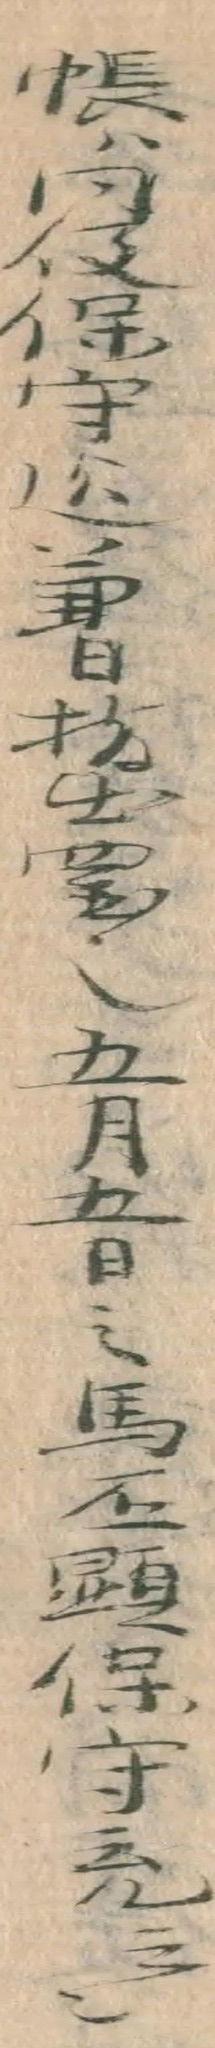帳ハ同役保守迄兼日指出置也五月五日之馬丕顕保守充云々
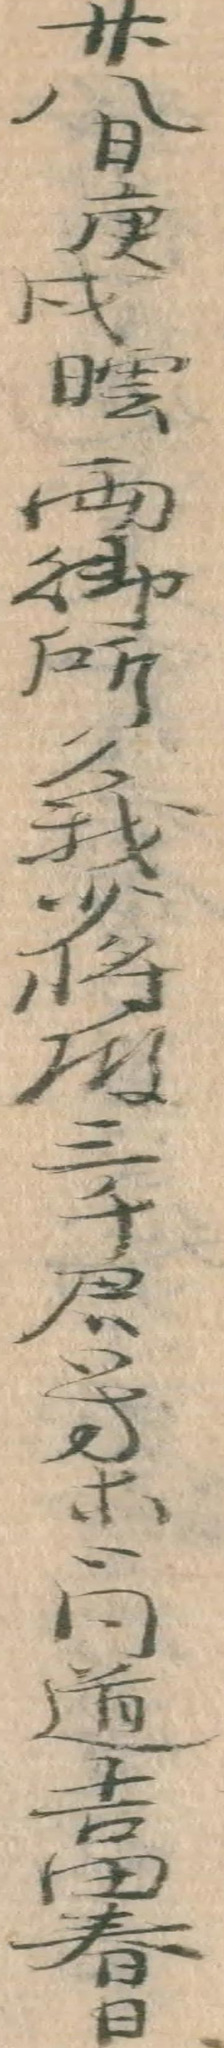廿八日庚戌曇両御所久我少将殿ミチ君御方等御同道吉田春日
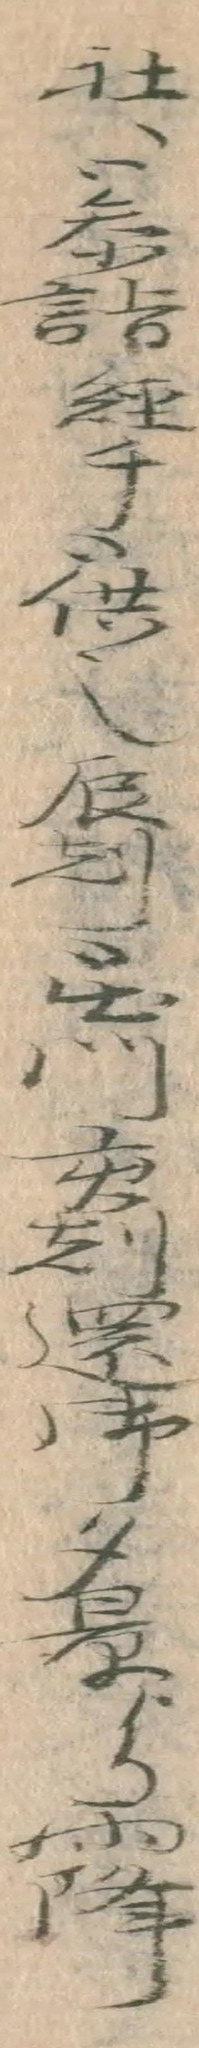社へ御参詣経千御供也辰刻御出門亥刻還御夕景より雨降
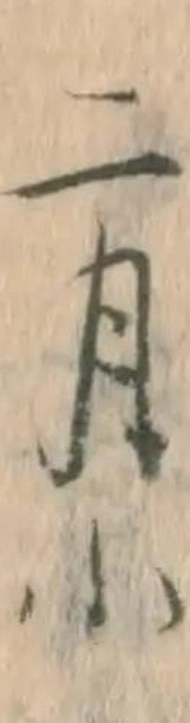二月小
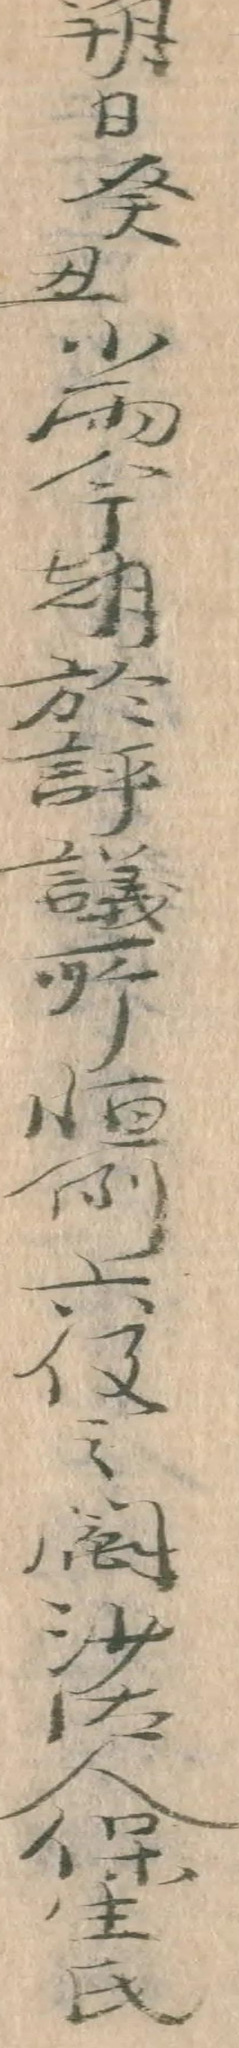朔日癸丑小雨今朝於評議所恒例六役之鬮沙汰人保生氏
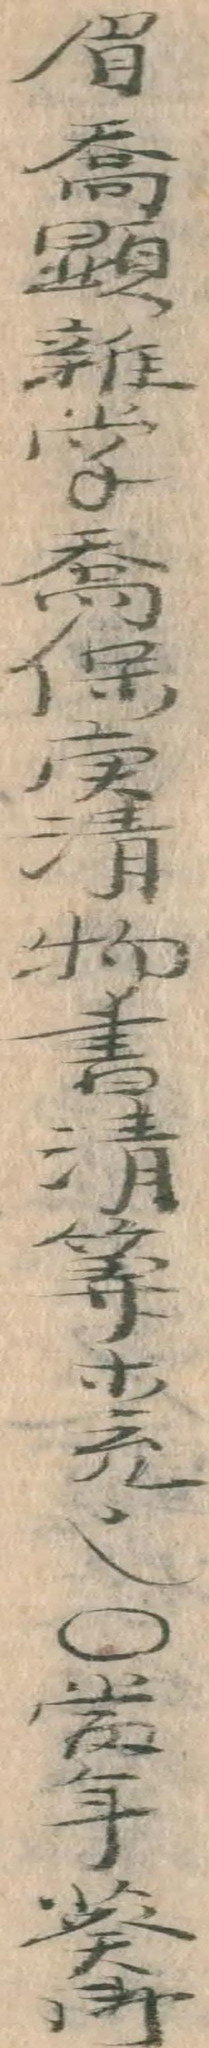眉喬顕雑掌喬保庚清物書清算等充也○當年葵御
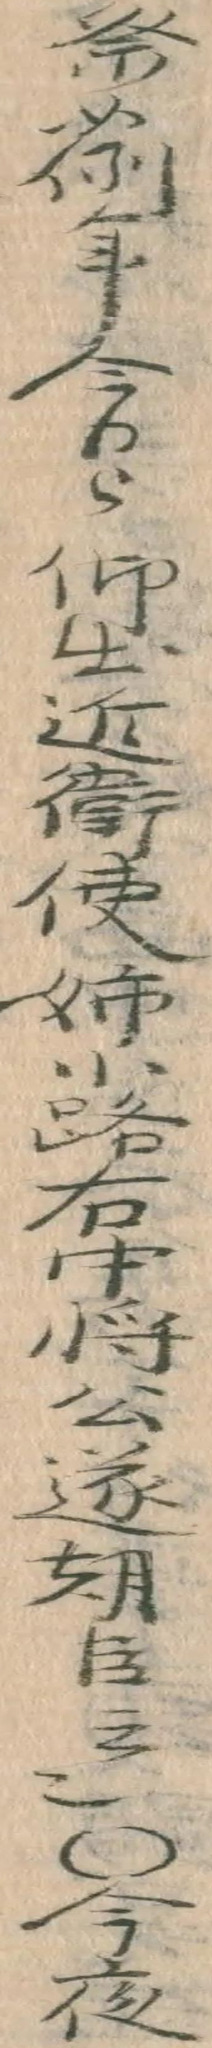祭如例年今日被仰出近衛使姉小路右中将公遂朝臣云々○今夜
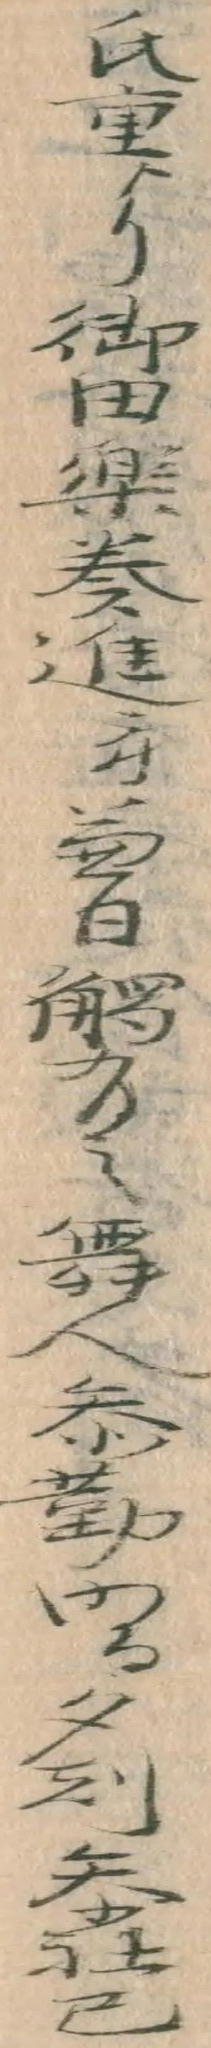氏重より御田楽奏進ニ付兼日触有之舞人参勤仍而夕刻参社已
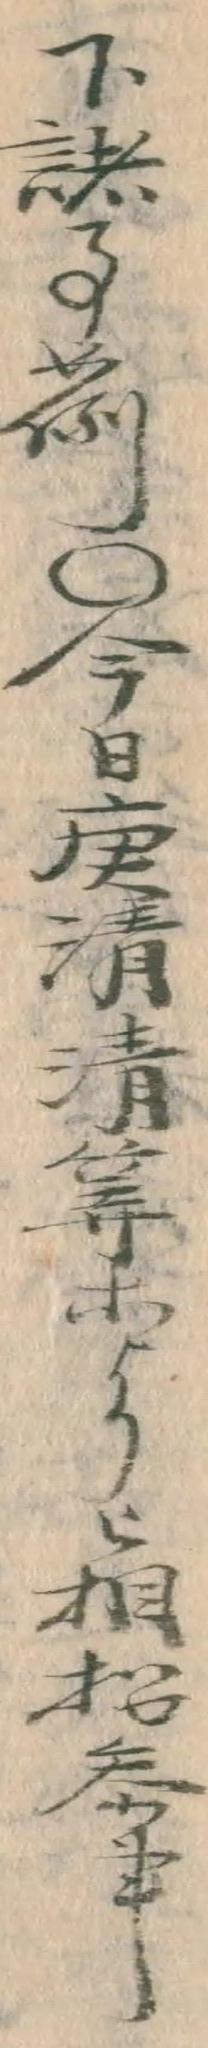下諸事如例○今日庚清清算等より被相招参事
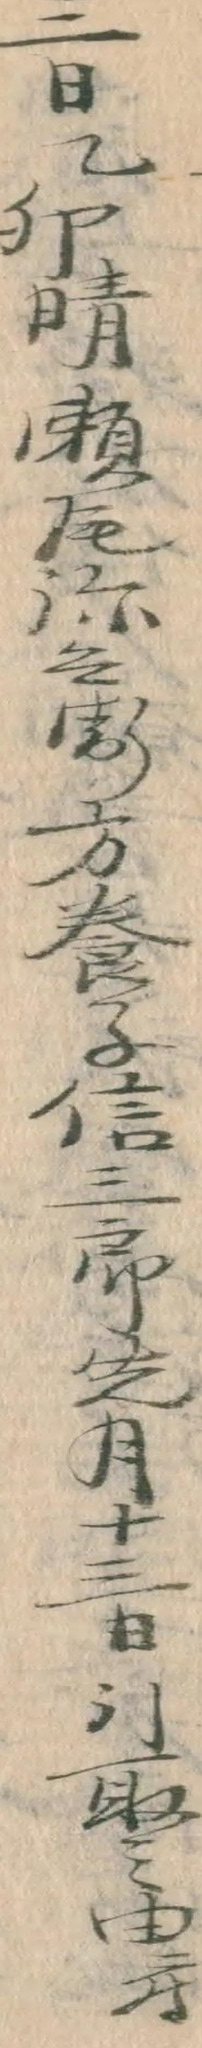三日乙卯晴瀬尾弥兵衛方養子信三郎先月十三日引取之由二付
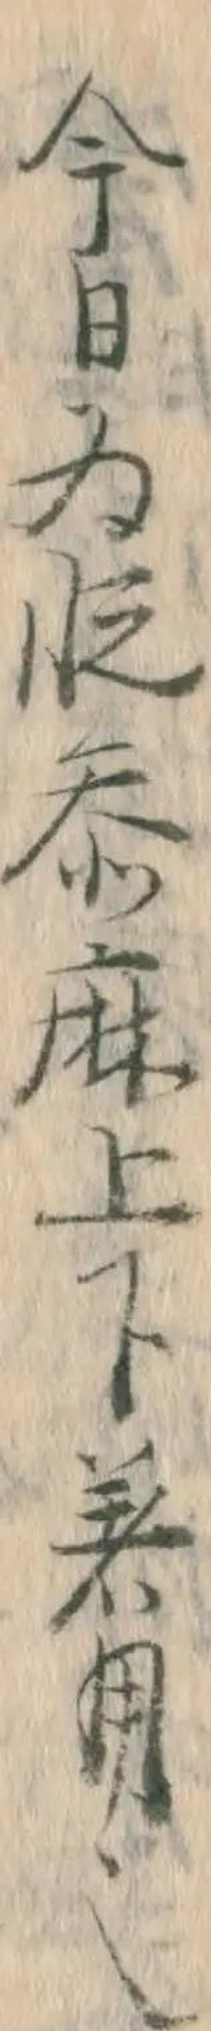今日為段参麻上下着用也
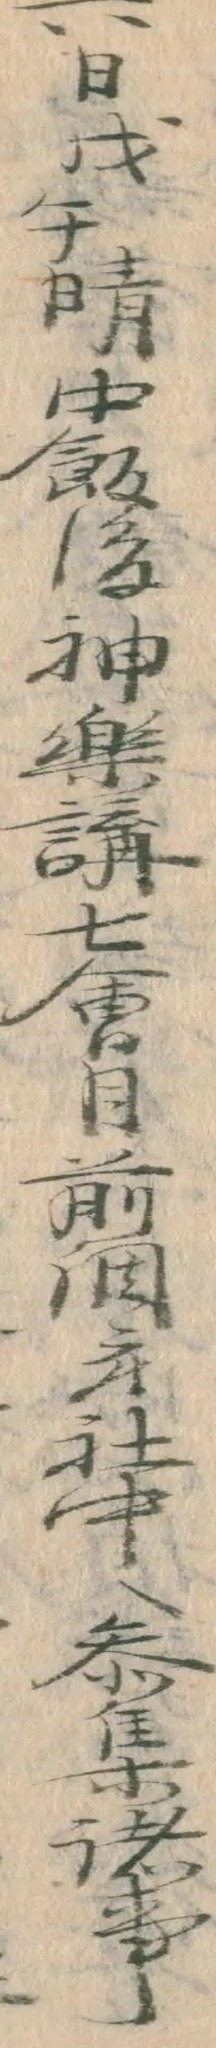六日戊午晴中飯後神楽講七會目前調ニ付社中へ参集諸事
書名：賀茂社記録. 第65冊
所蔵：国立国会図書館 National Diet Library, JAPAN
